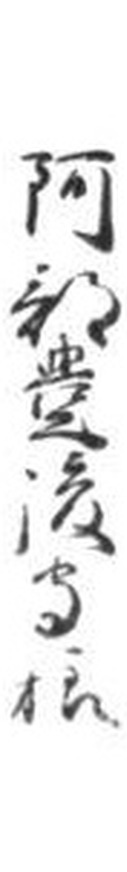阿部豊後守様
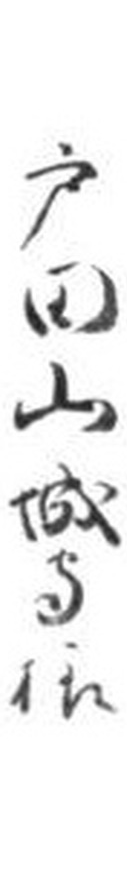戸田山城守様
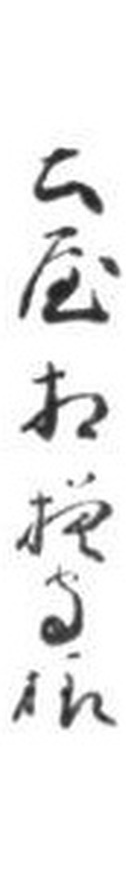土屋相模守様
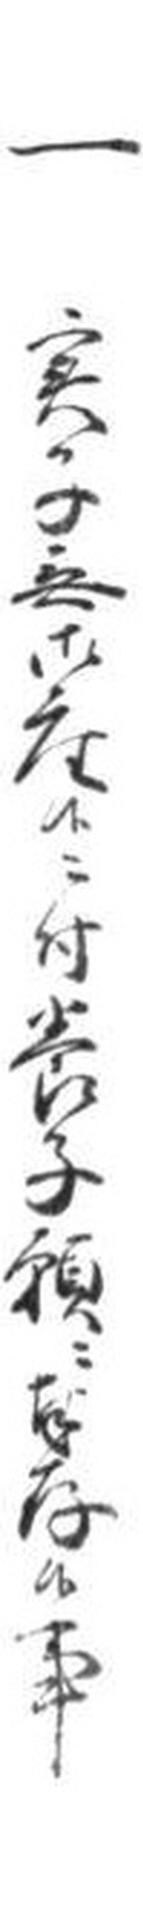一実子無御座候ニ付養子願ニ奉存候事
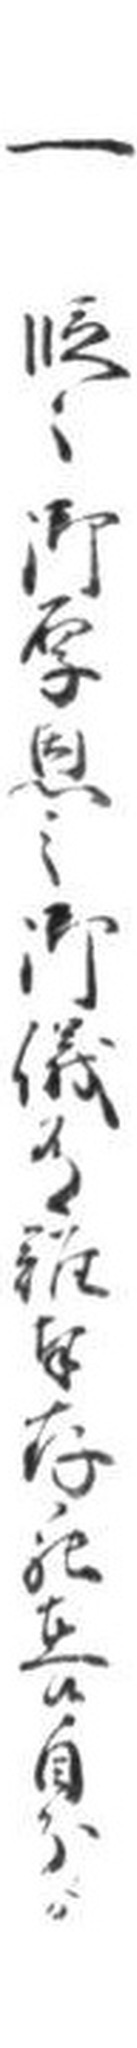一段々御厚恩之御儀有難奉存罷在候自分ゟ
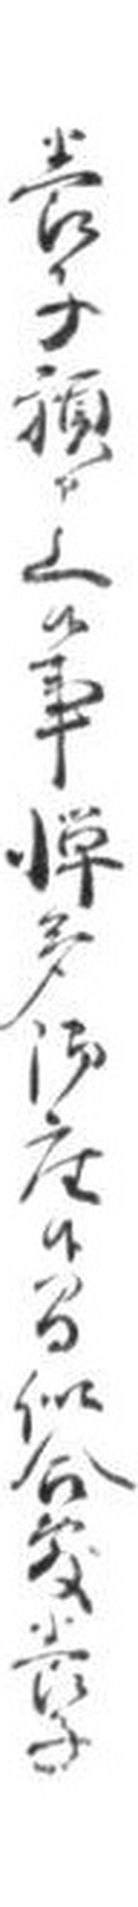養子願申上候事憚多御座候間似合敷養子
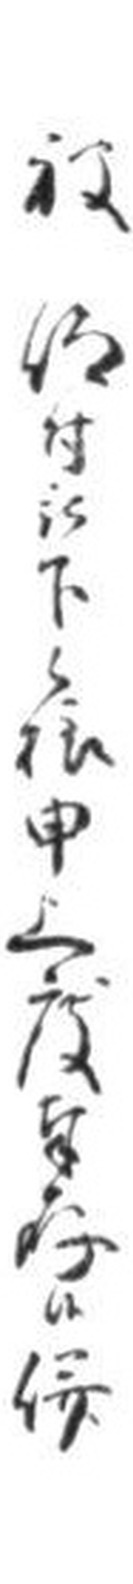被仰付被下之様申上度奉存候併
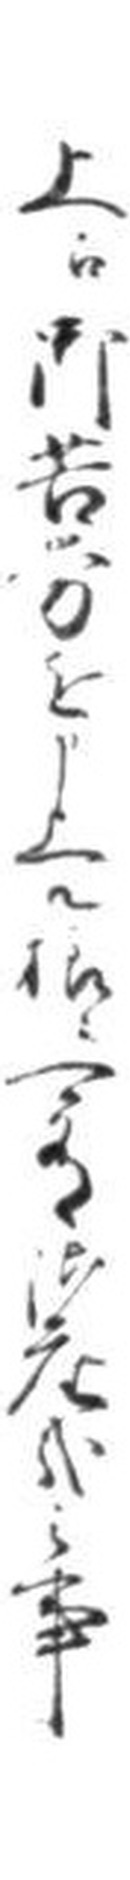上江御苦労を申上ル様ニ可有御座哉之事
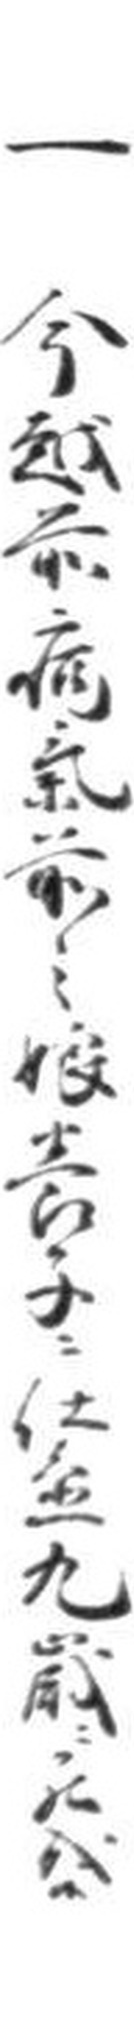一今越前病気前之娘養子ニ仕置九歳ニ罷成候
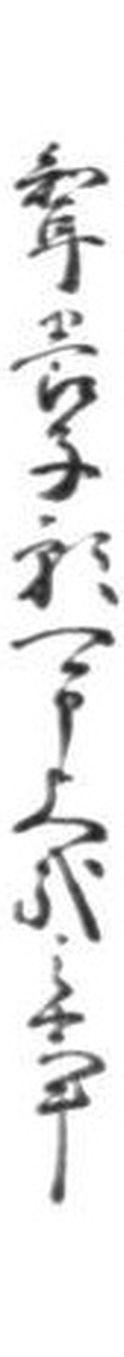聟養子願可申上哉之事
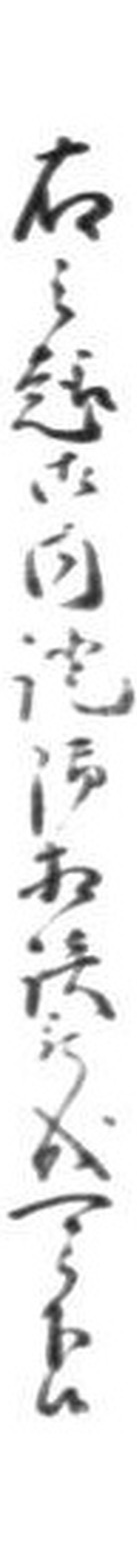右之趣御内証御相談被成可被下候
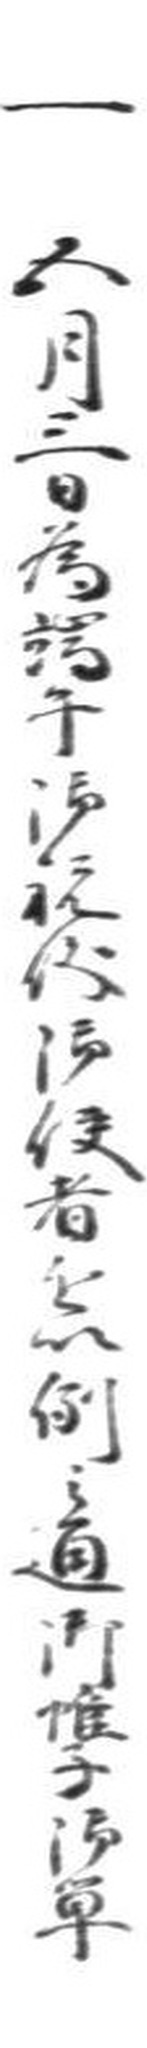一五月三日為端午御祝儀御使者を以例之通御帷子御単

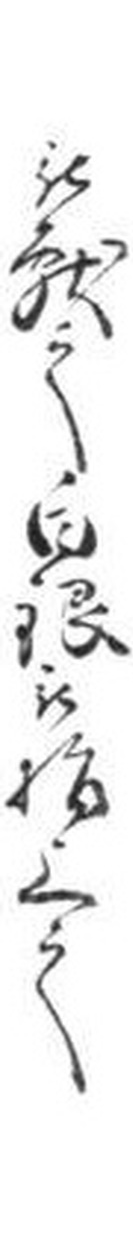被献之白銀被指上之
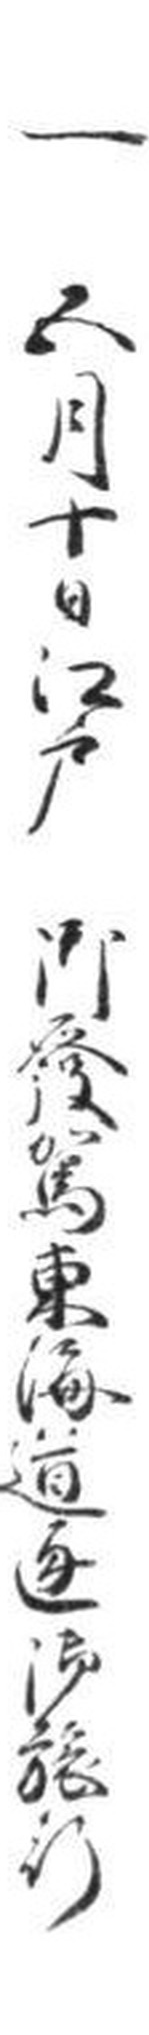一五月十日江戸御発駕東海道通御旅行
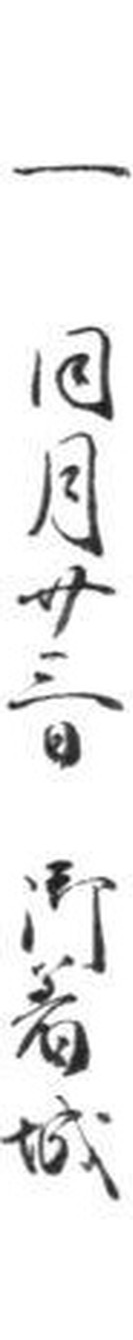一同月廿三日御着城
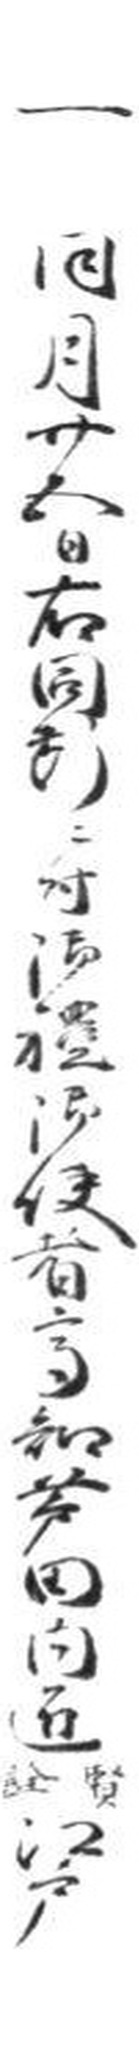一同月廿五日右同断ニ付御礼御使者高知芦田内匠賢詮江戸
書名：家譜 十七 吉品公 従元禄元年到同二年
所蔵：福井県文書館 Fukui Prefectural Archives
